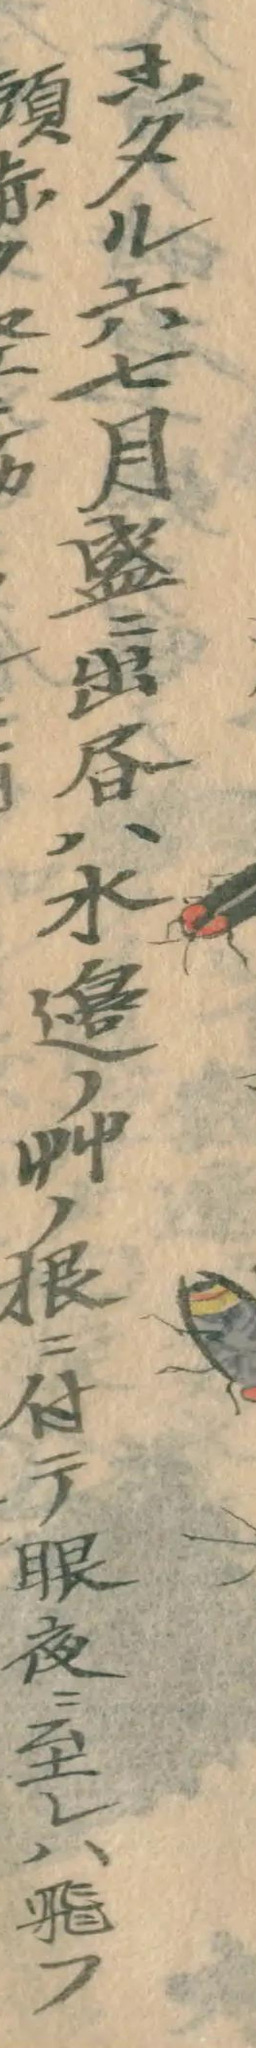蛍火ホタル六七月盛ニ出昼ハ水邉ノ艸ノ根ニ付テ眠夜ニ至レハ飛フ
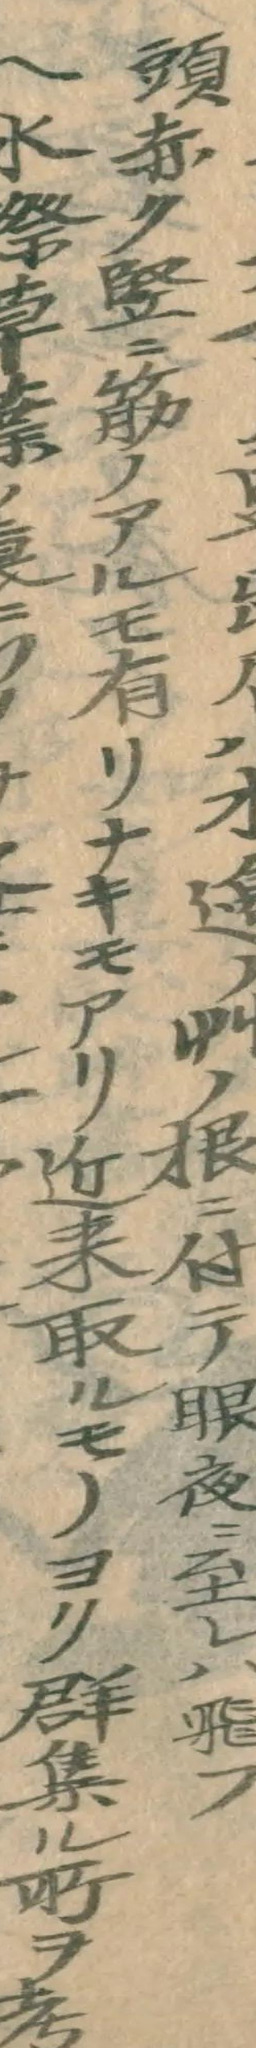頭赤ク竪ニ筋ノアルモ有リナキモアリ近来取ルモノヨク群集ル所ヲ考
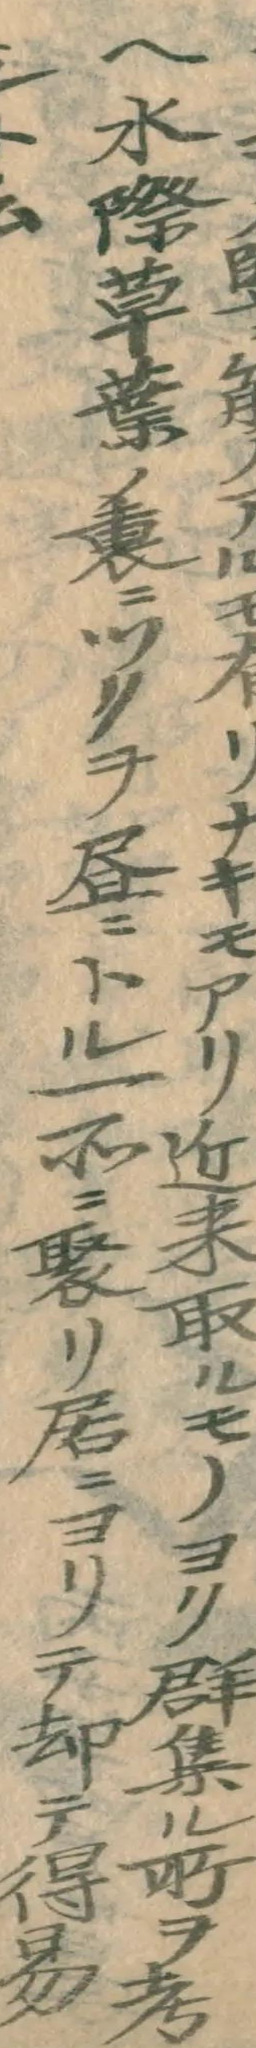ヘ水際草葉ノ裏ニツクヲ昼ニトル一所ニ聚リ居ニヨリテ却テ得易
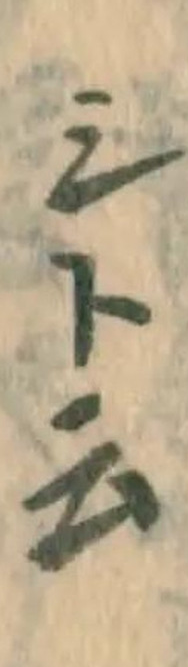シト云

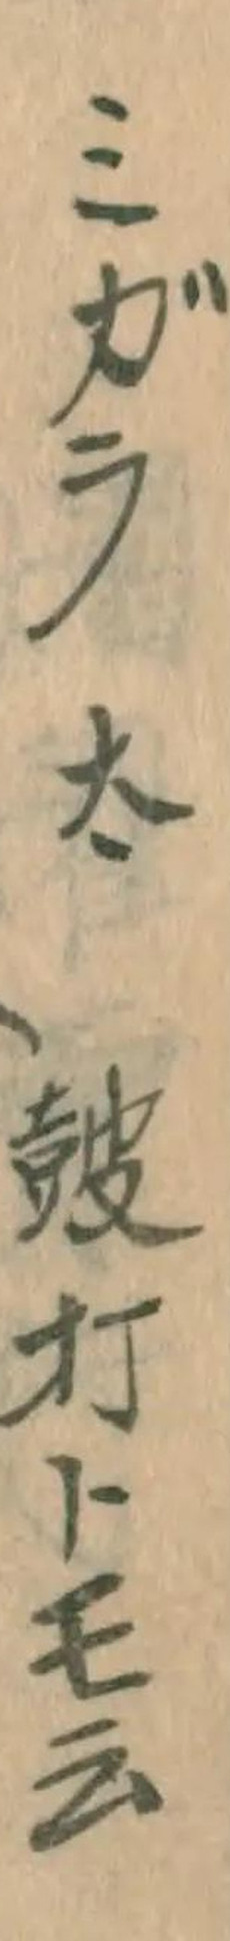ミガラ太鼓打トモ云
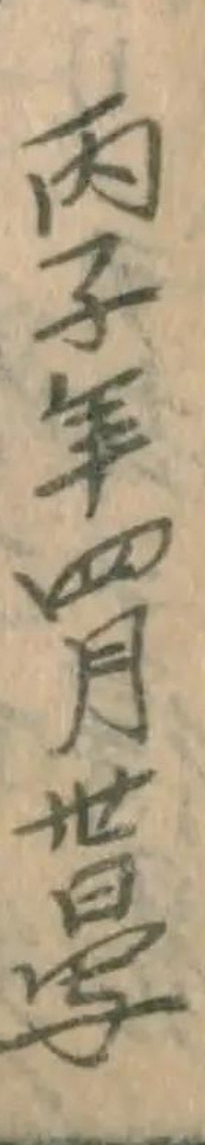丙子年四月卅日写
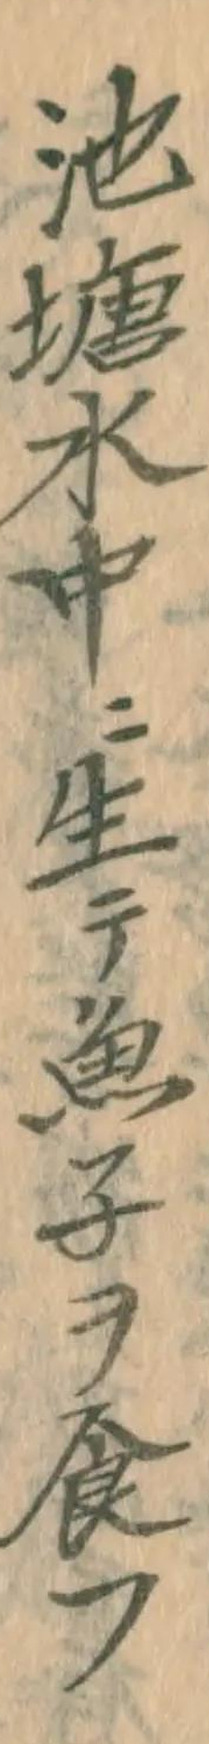池塘水中ニ生テ魚子ヲ食フ
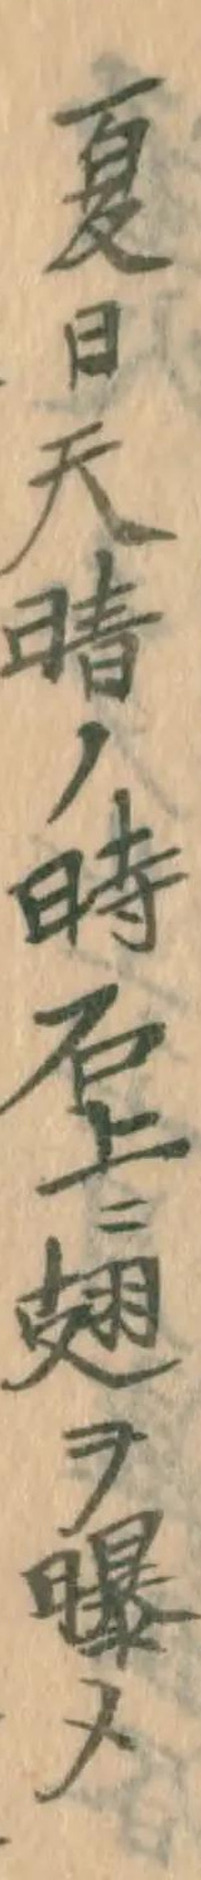夏日天晴ノ時石上ニ翅ヲ曝シテ
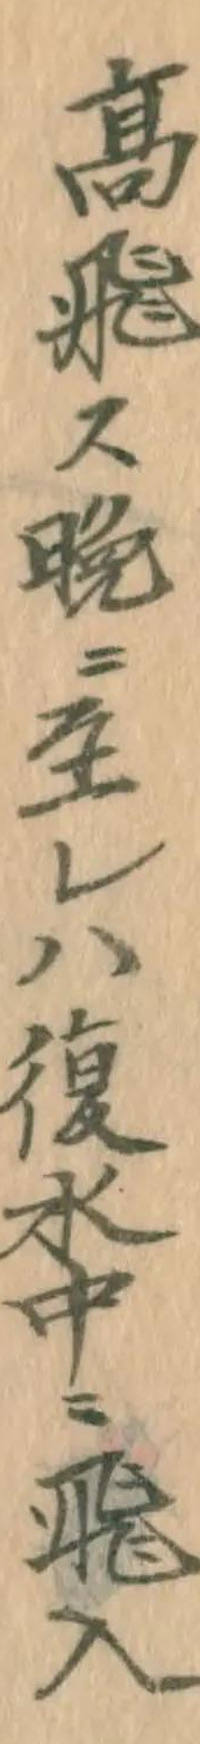髙飛ス晩ニ至レハ復水中ニ飛入
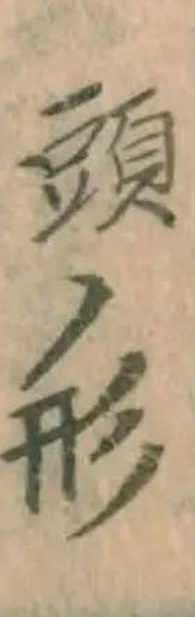頭ノ形
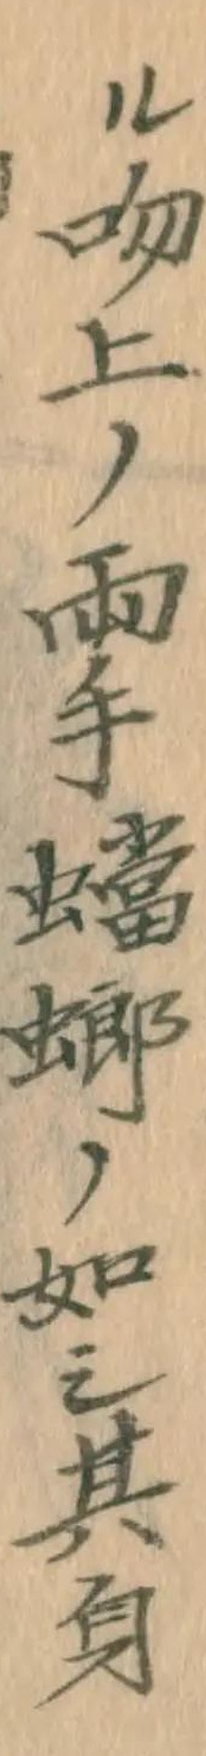ル吻上ノ両手蟷螂ノ如シ其身
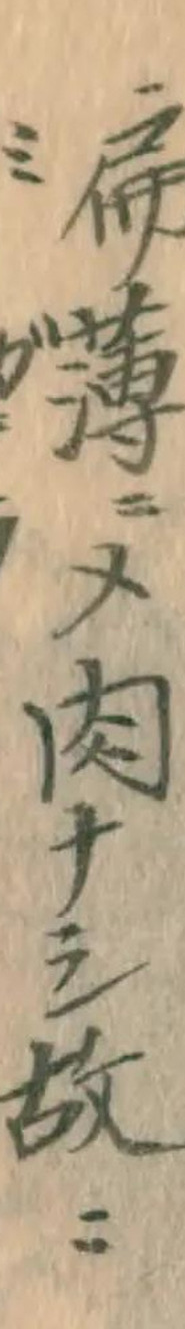扁薄ニシテ肉ナシ故ニ
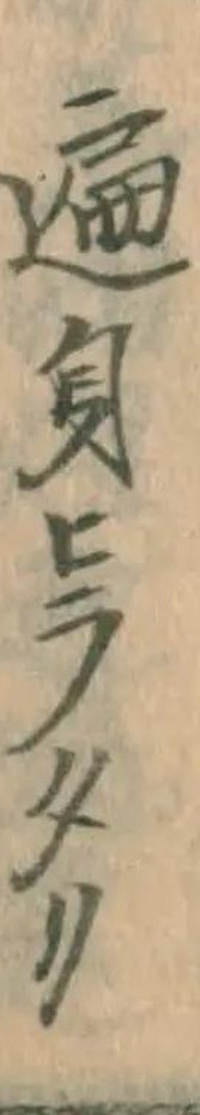遍身ヒラタク
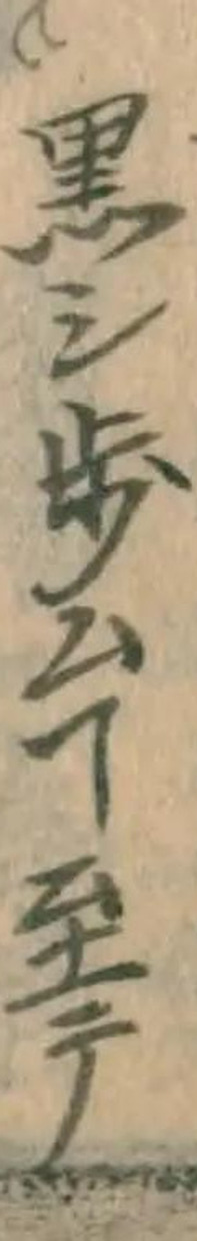黒シ歩ムコト至テ
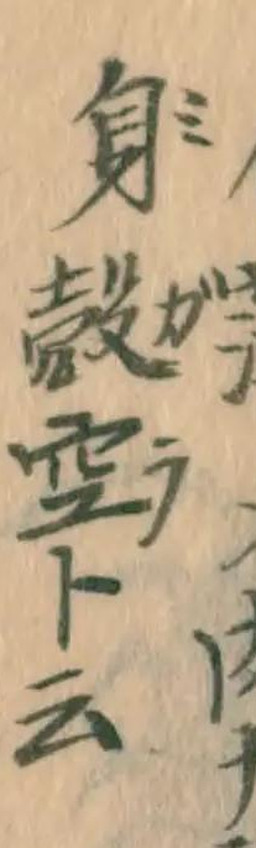身殻空ト云
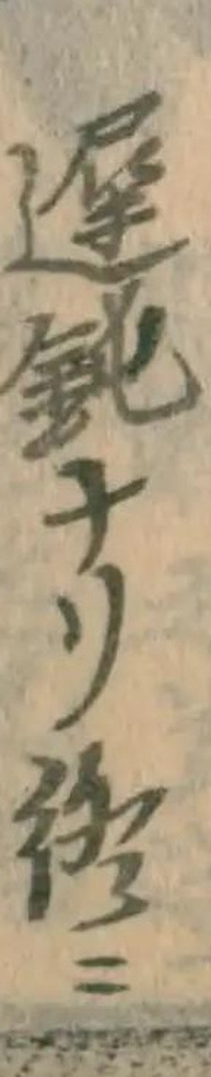遅鈍ナリ終ニ
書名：千蟲譜 3巻. [2]
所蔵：国立国会図書館 National Diet Library, JAPAN
